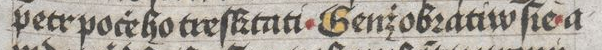petr poče ho treſktati.Genż obratiw ſe.a
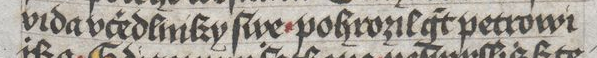vida včedlniky ſwe.pohrozil ḡt petrowi
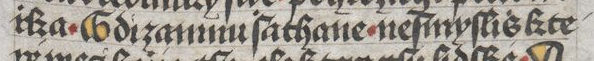ṙka.Gdi za mnu ẛathane.neſmyſliṡ kte¬
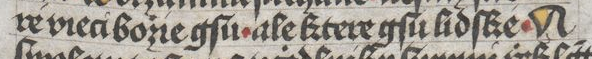ré vieci bożíe gſu.ale které gſu lidſké.A
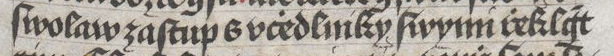ſwolaw zaſtup s vċedlniky ſwymi ṙekl ḡt
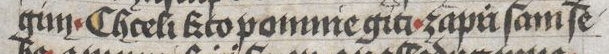gím.Chteli kto po mnie gíti. zapṙi ſam ſe¬
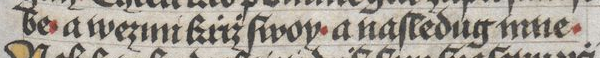be a wezmi kṙiż ſwoy.a naſledug mne.
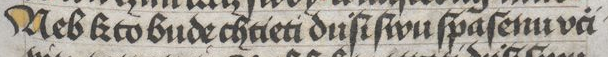Neb kto bude chtieti duẛi ſwu ſpaſenu vċi¬
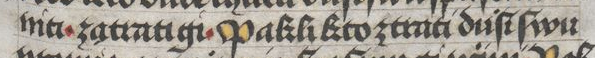niti zatrati gi. Pakli kto ztratí duẛi ſwu
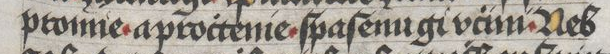promie.a proċteníe.ſpaſenu gi vċiní.Neb
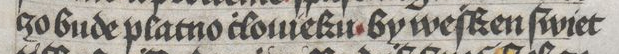czo bude platno ċlouieku.by weẛken ſwiet
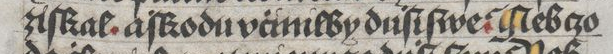ziſkal.aẛkodu vċinilby duẛi ſwe? Neb czo
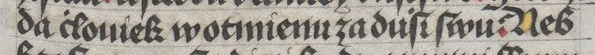da ċlouiek w otmienu za duẛi ſwu?Neb
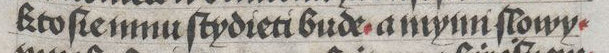kto ſiemnu ſtydieti bude.a mymi ſlowy.
